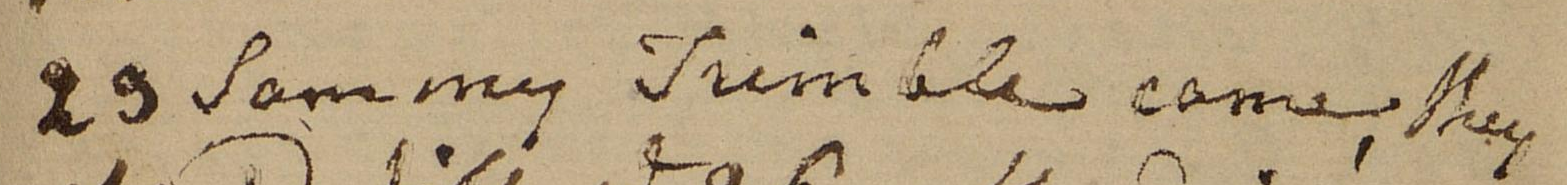23 Sammy Trimble came, they
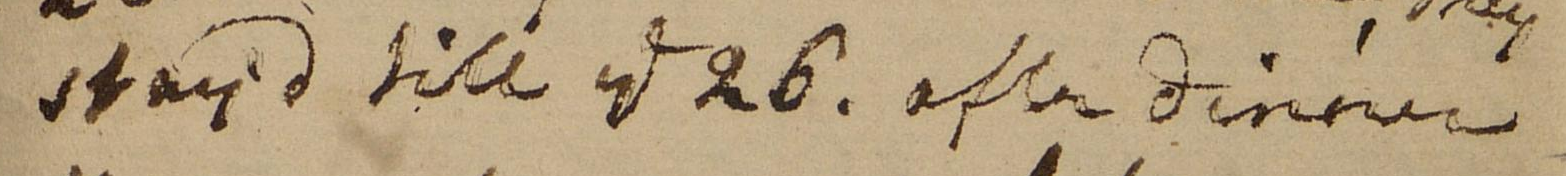stay'd till y^e 26. after dinner
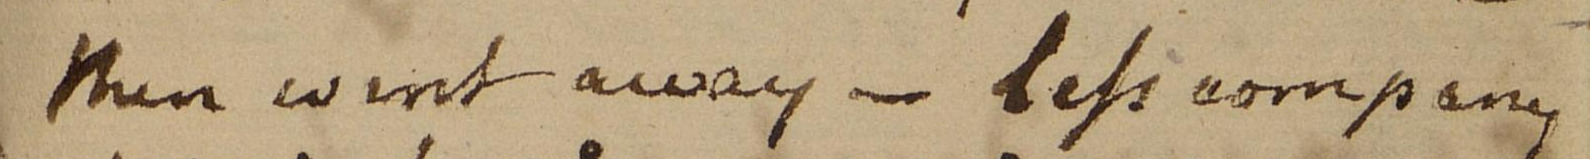then went away- less company
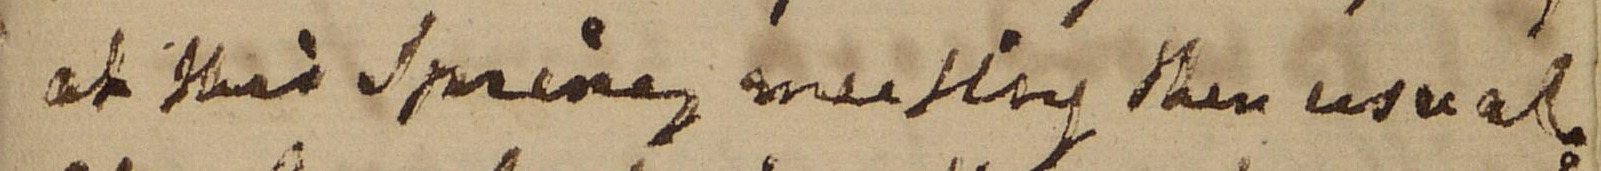at this Spring meeting than usual
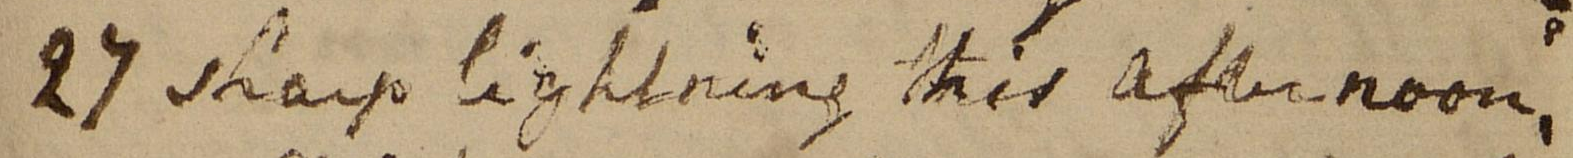27 sharp lightning this Afternoon,
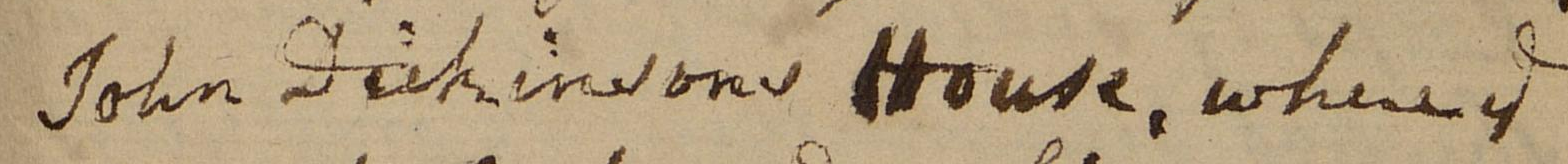John Dickinsons House, where y^e
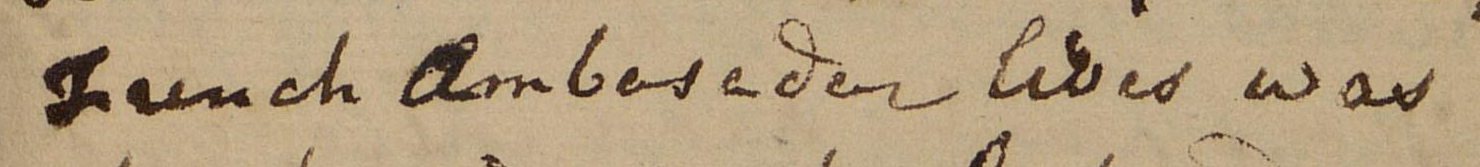French Ambasader [lives] as
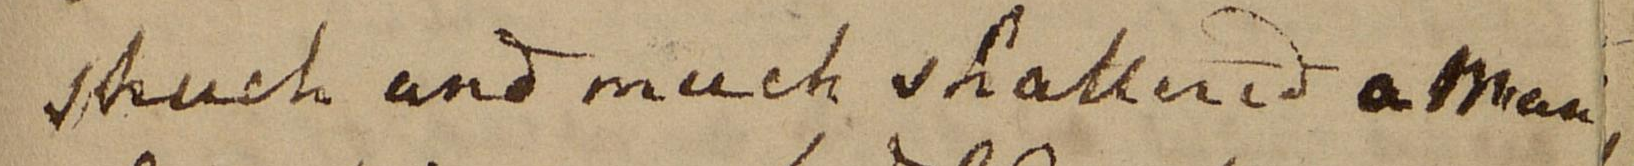skuch and much shattered a Man
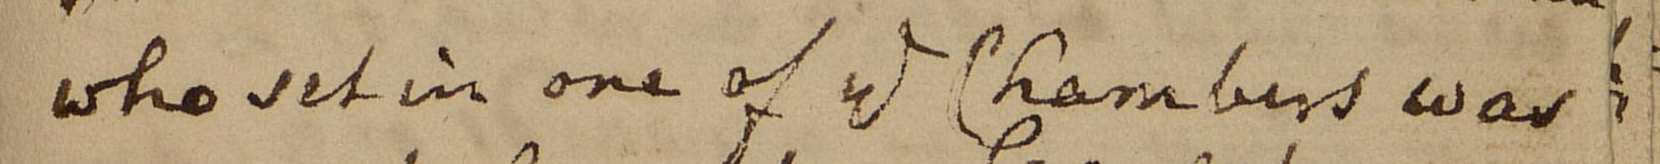who set in one of y^e Chambers was
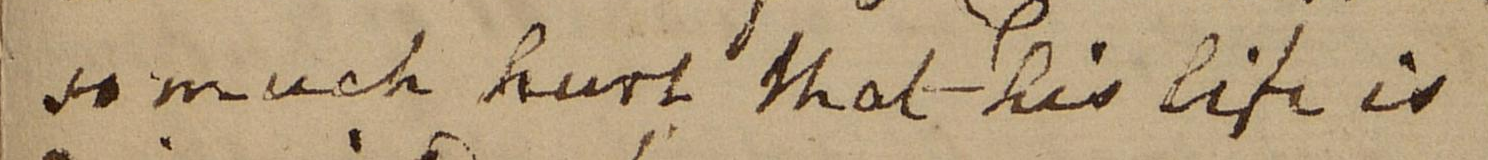so much hurt that his life is
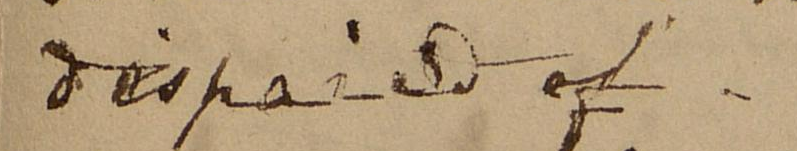dispair'd of
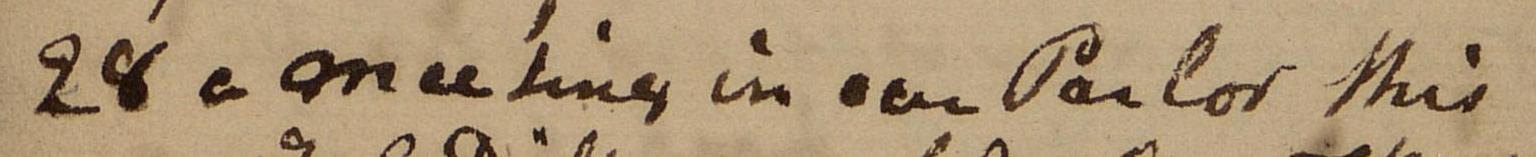28 a meeting in our Parlor this
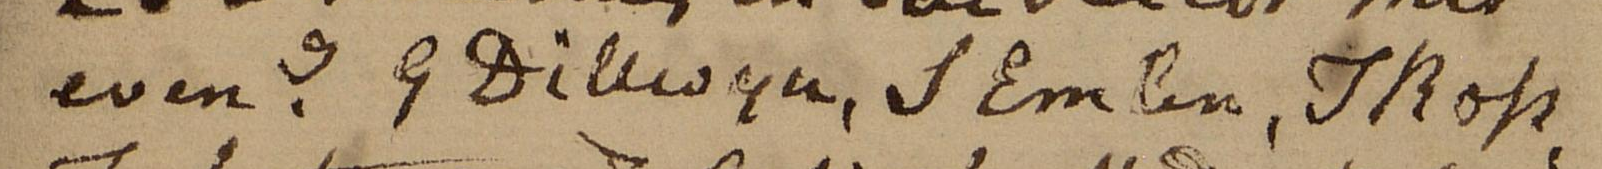even^g. G Dillwyn, S Emlen, T Ross,
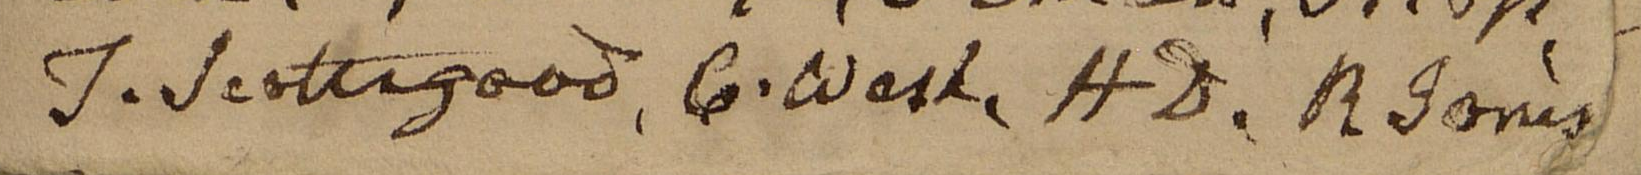T. Scattergood, C. West. H D. R Jones
